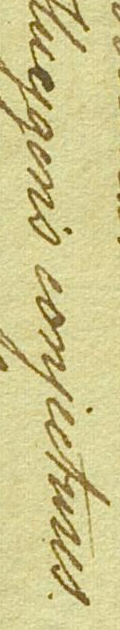Huygen's conjectures.
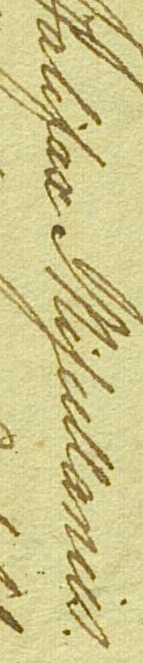Halifax Miscellanies.
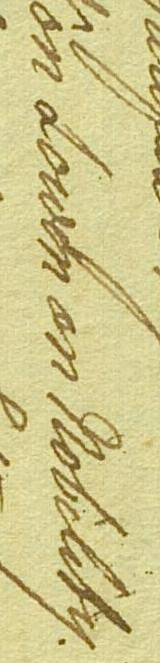Von Lowen on Nobility.
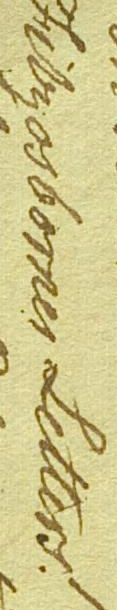Fitzosbornes Letters.
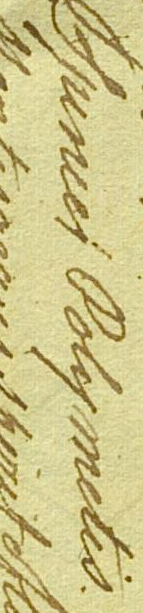Spence's Polymetis.
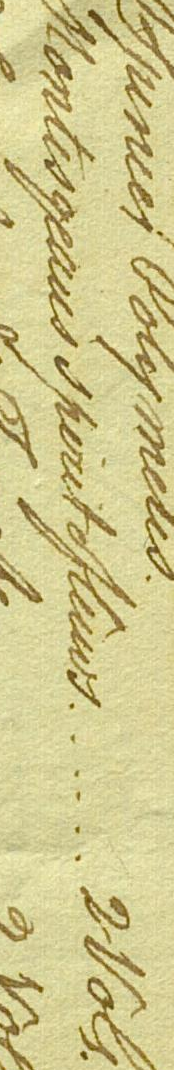Montesqeau's spirit of laws . . . . . . 2 Vols.
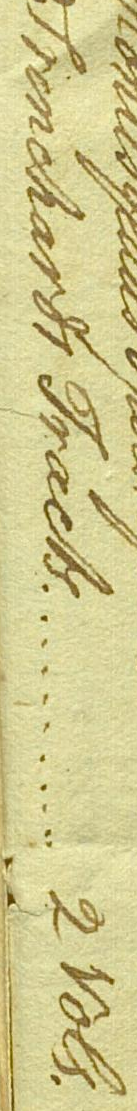Trenchards Tracts . . . . . . . . 2 Vols.
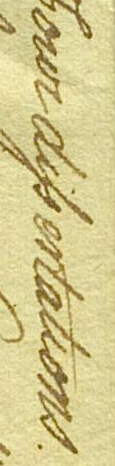Four dissertations.
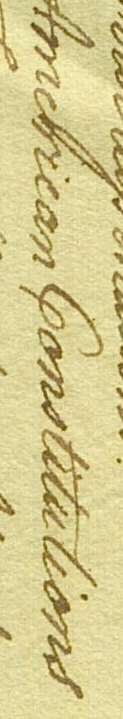American Constitutions
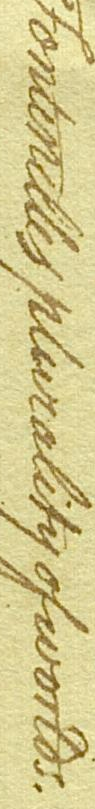Fontenelles plurality of worlds.
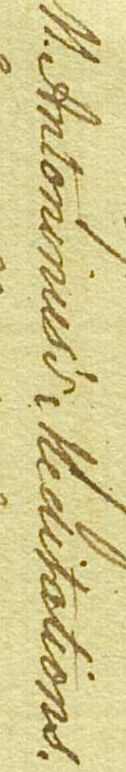M. Antoninus's Meditations.
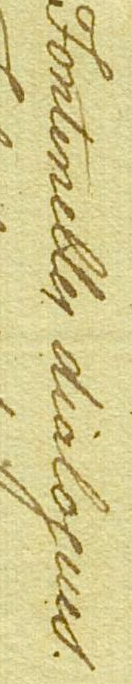Fontenelles dialogues.
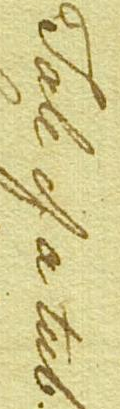Tale of a tub.
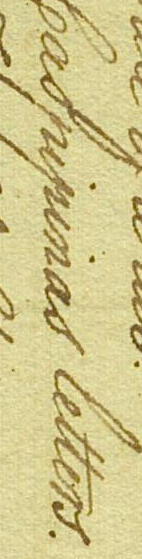Caspipinas letters.
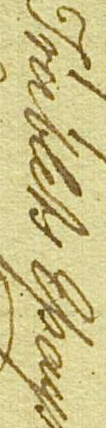Trublers Essays.
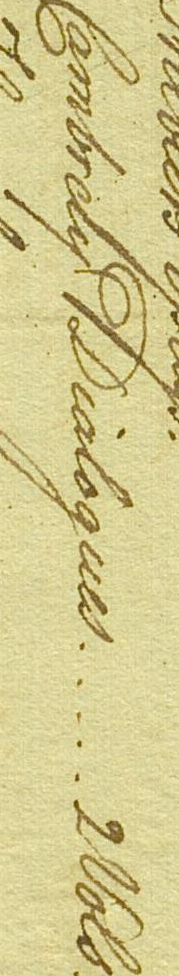Cambray Dialogues..... 2 Vols
